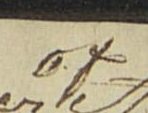of
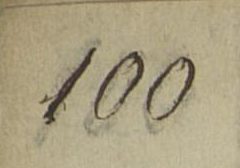100
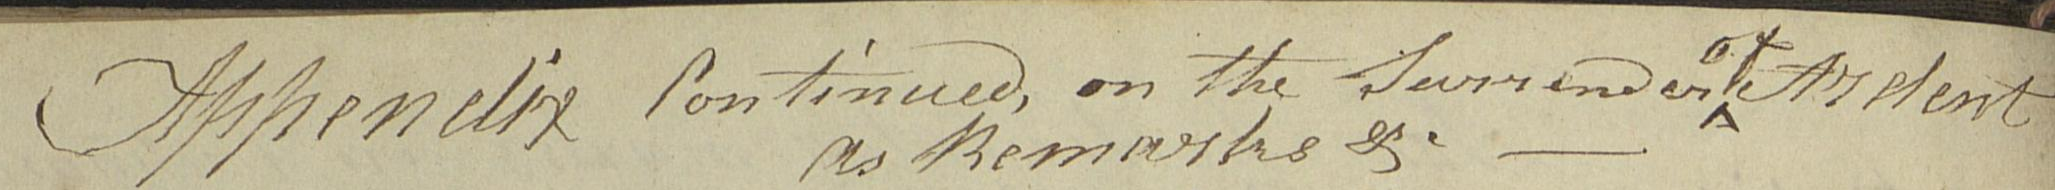Appendix Continued, on the Surender ^ Ardent
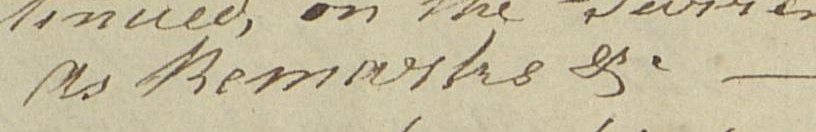As Remarks &^c
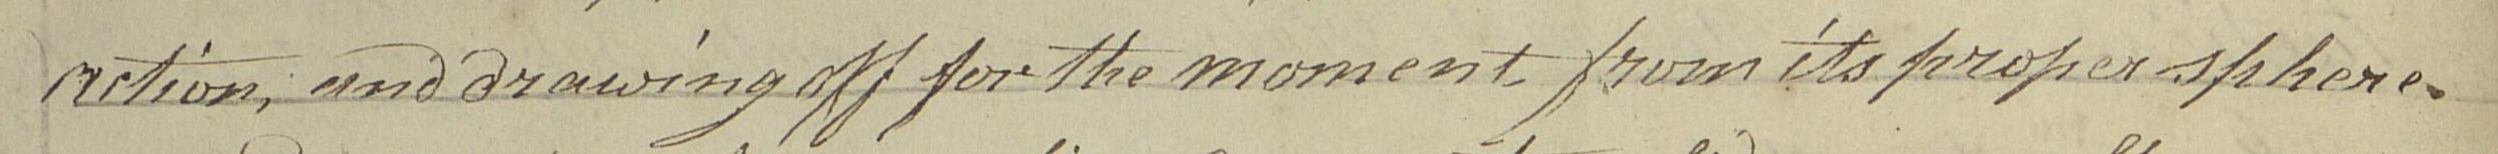action, and drawing off for the moment from its proper sphere.
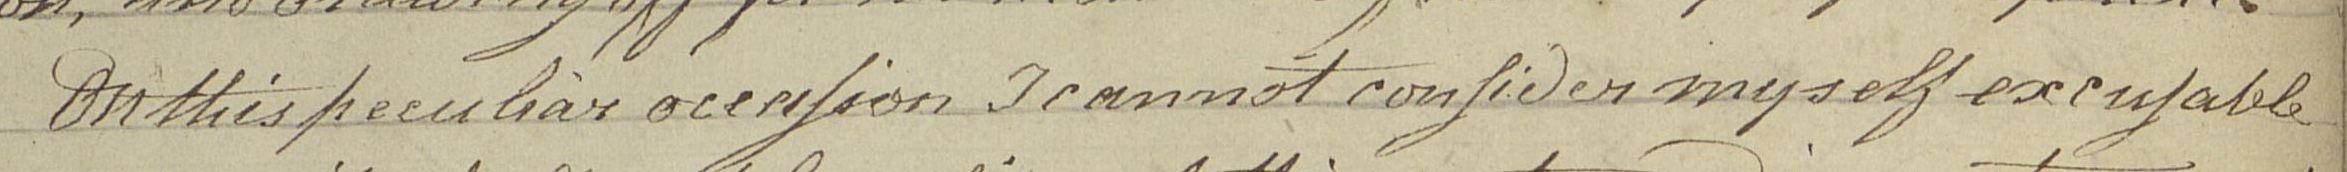On this peculiar occassion I cannot consider myself excusable
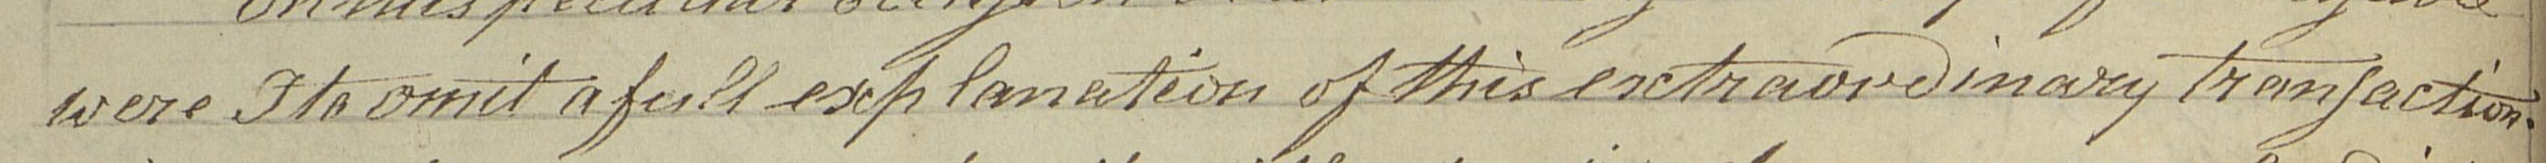were I to omit a full explanation of this extraordinary transaction
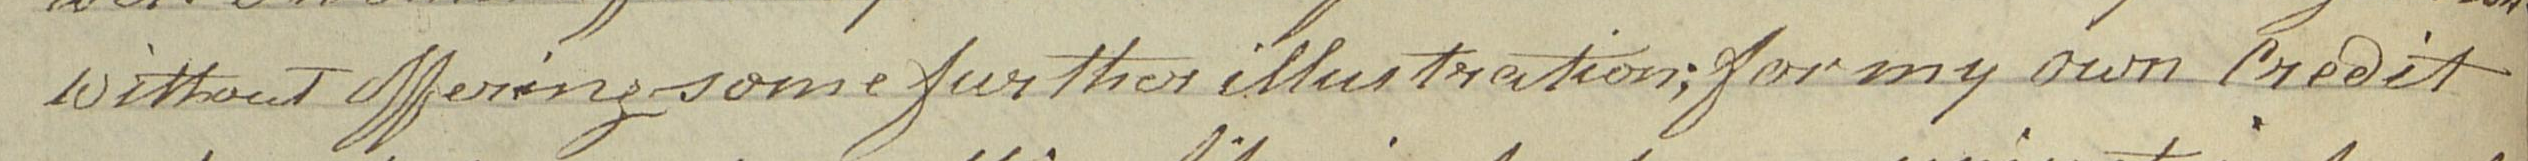without offering some further illustration; for my own Credit
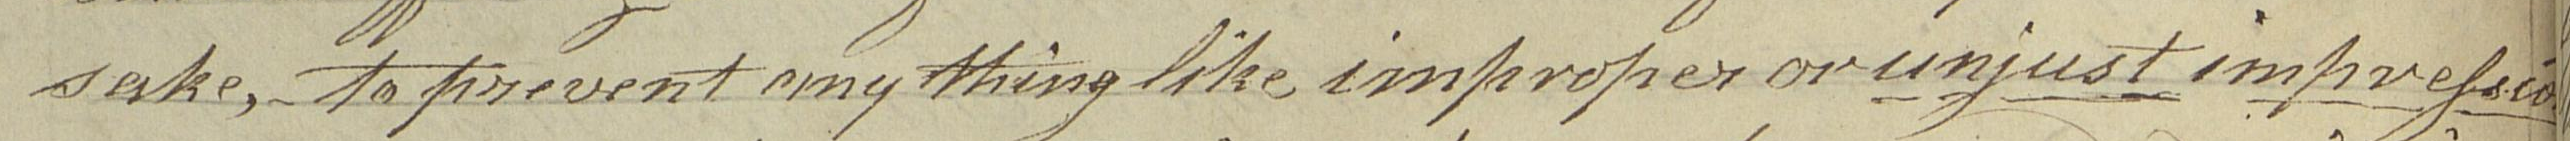sake, to prevent any thing like improper or unjust impression
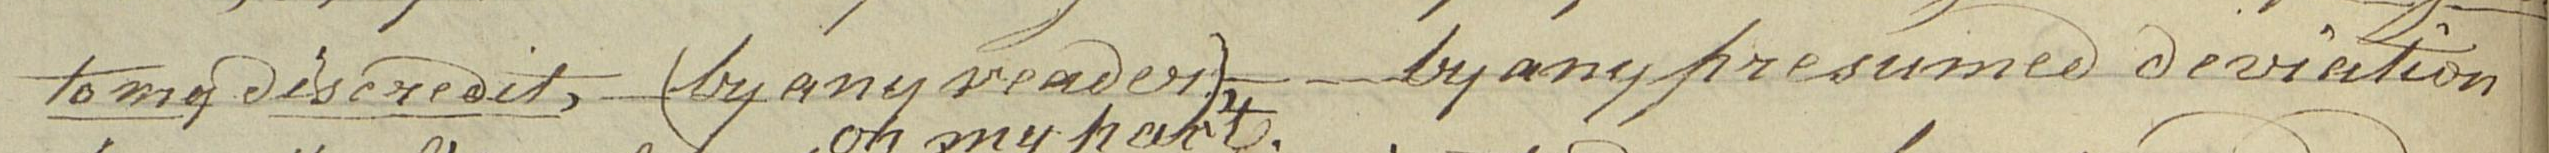to my discredit, (by my reader) by any presumed deviation
